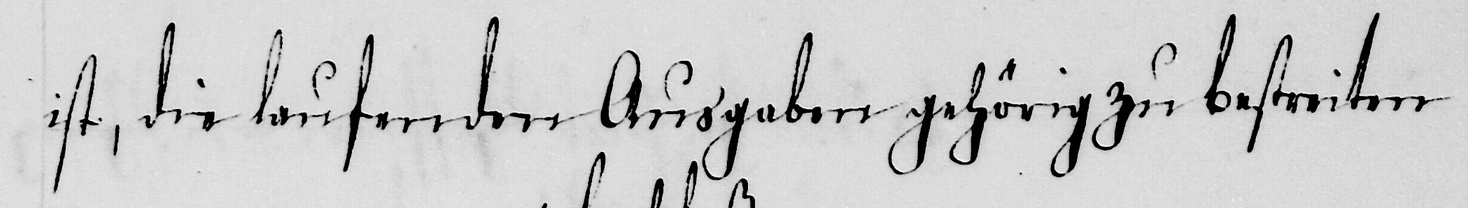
ist, die laufenden Ausgaben gehörig zu bestreiten
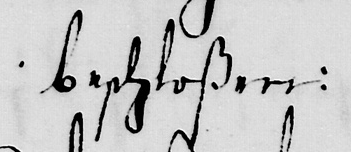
beschloßen:
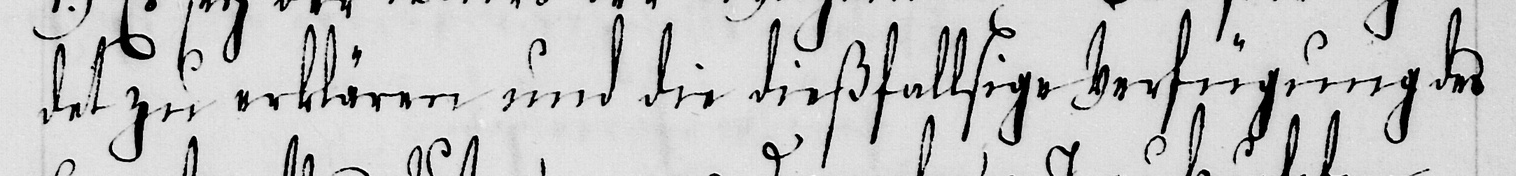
det zu erklären und die dießfallsige Verfügung des
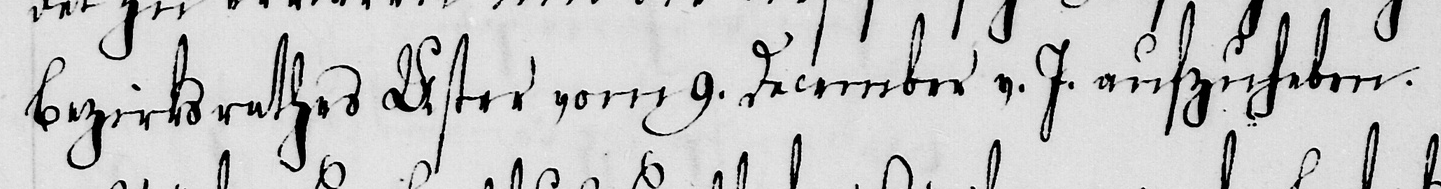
Bezirksrathes Uster vom 9. December v. J. aufzuheben.
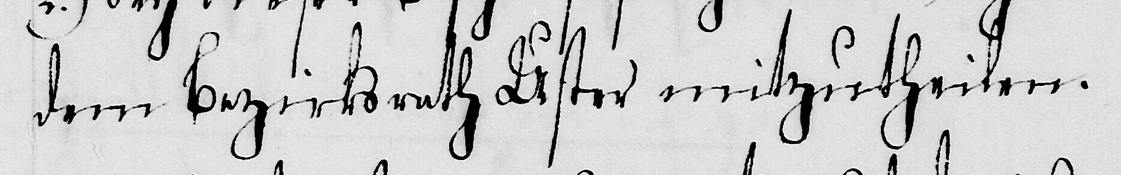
dem Bezirksrath Uster mitzutheilen.
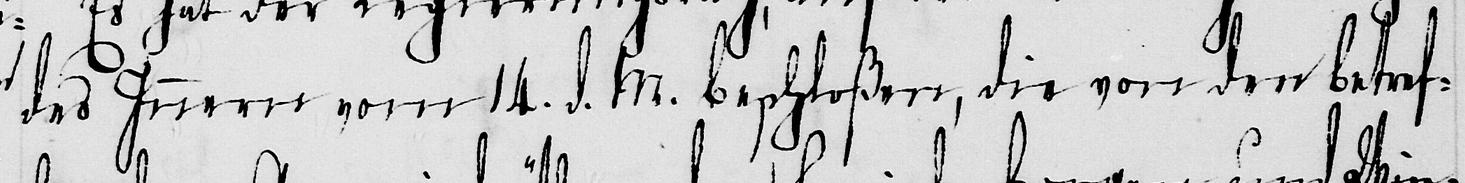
des Innern vom 14. d. M. beschloßen, die von den betref¬
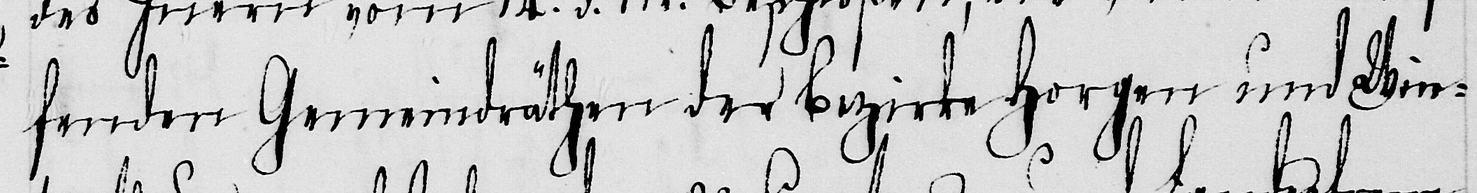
fenden Gemeindräthen der Bezirke Horgen und Win¬
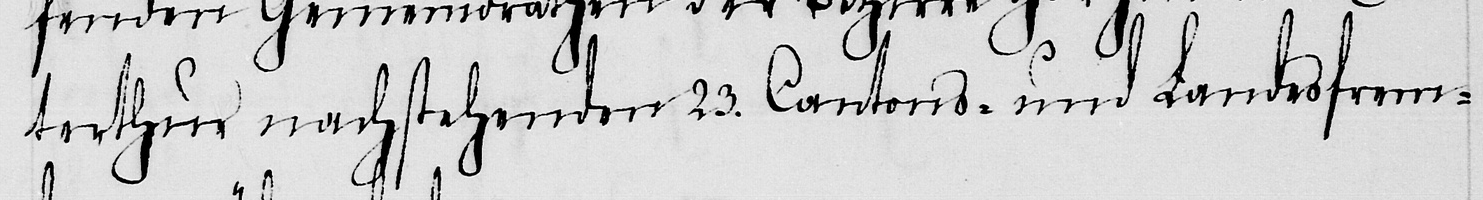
terthur nachstehenden 23. Cantons- und Landesfrem¬
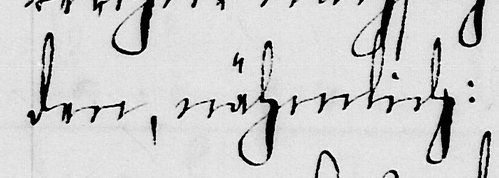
den, nähmlich:
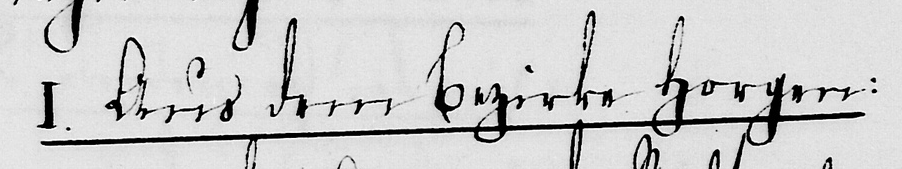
I. Aus dem Bezirke Horgen:
